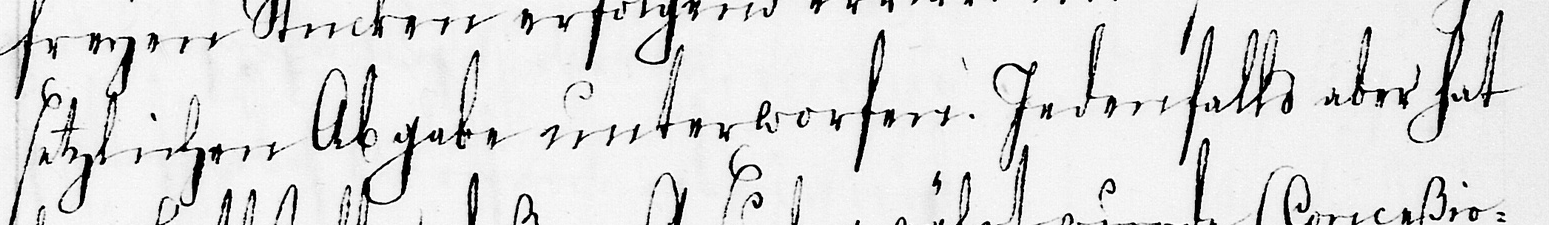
setzlichen Abgabe unterworfen. Jedenfalls aber hat
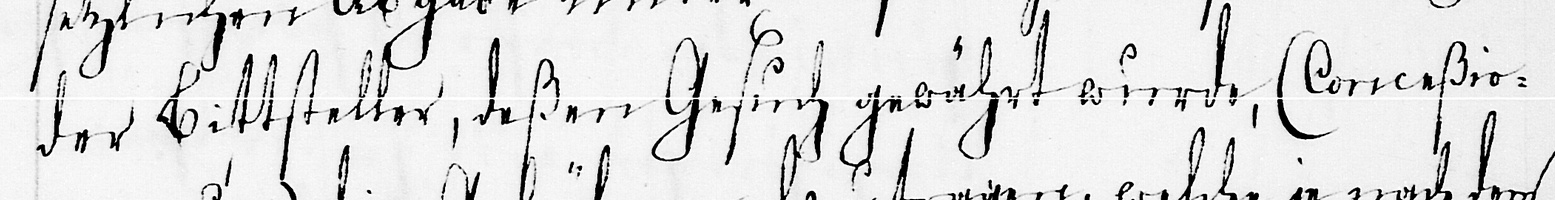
der Bittsteller, deßen Gesuch gewährt wurde, (Conceßio¬
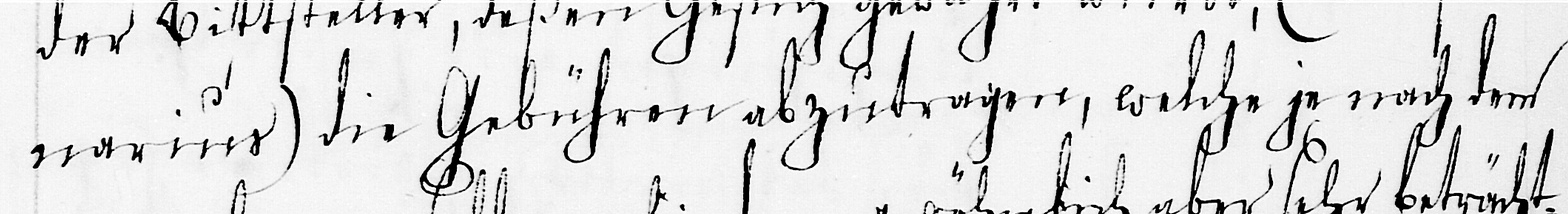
narius) die Gebühren abzutragen, welche je nach dem
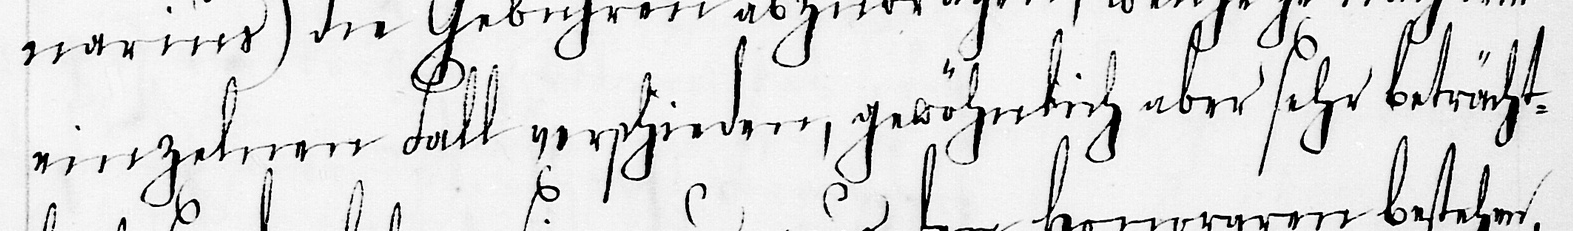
einzelnen Fall verschieden, gewöhnlich aber sehr beträcht¬
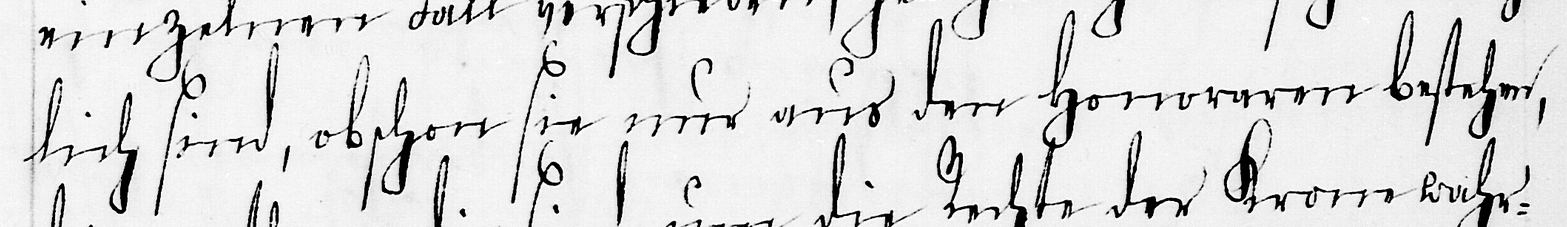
lich sind, obschon sie nur aus den Honoraren bestehen,
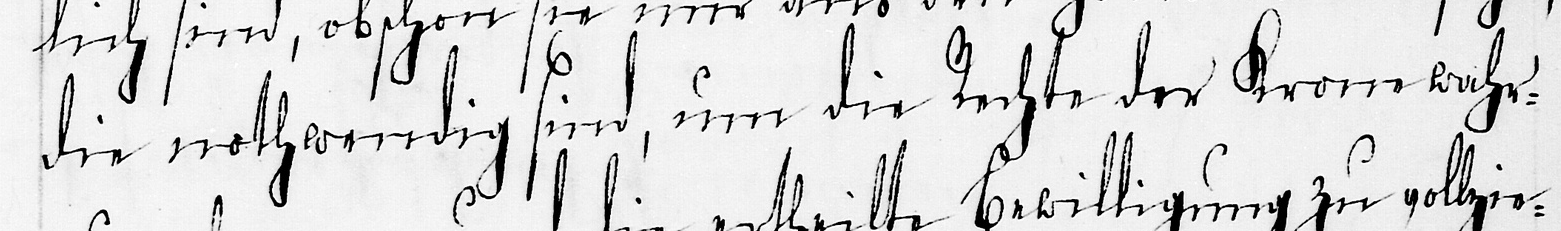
die nothwendig sind, um die Rechte der Krone wahr¬
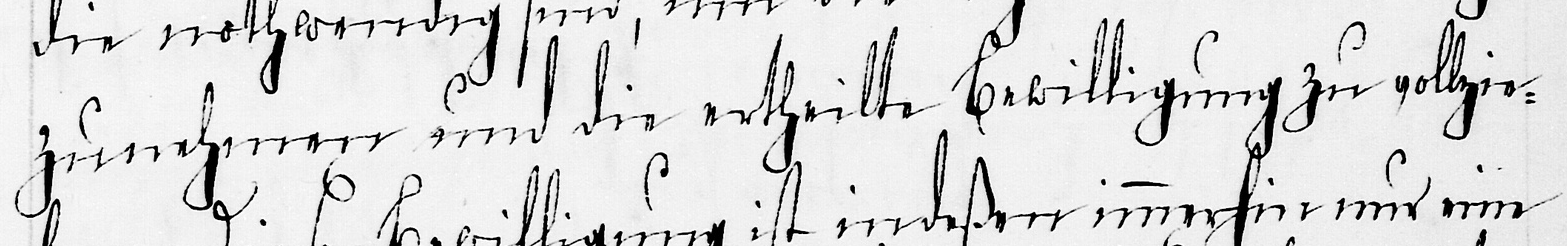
zunehmen und die ertheilte Bewilligung zu vollzi¬
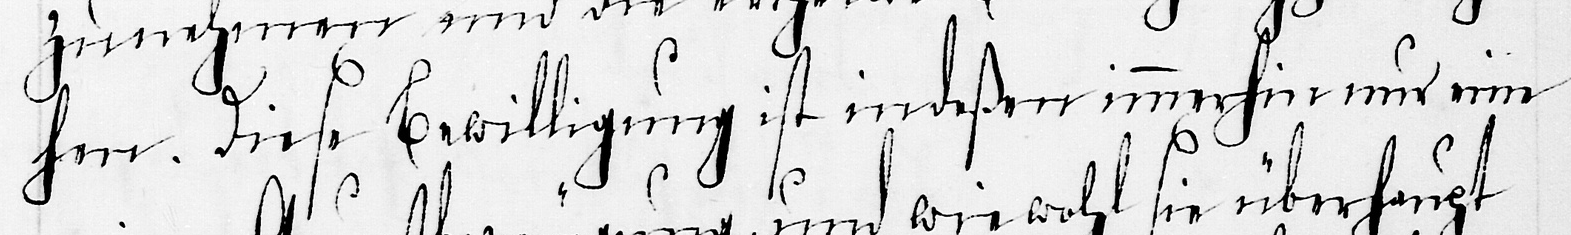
ehen. Diese Bewilligung ist indeßen immerhin nur eine
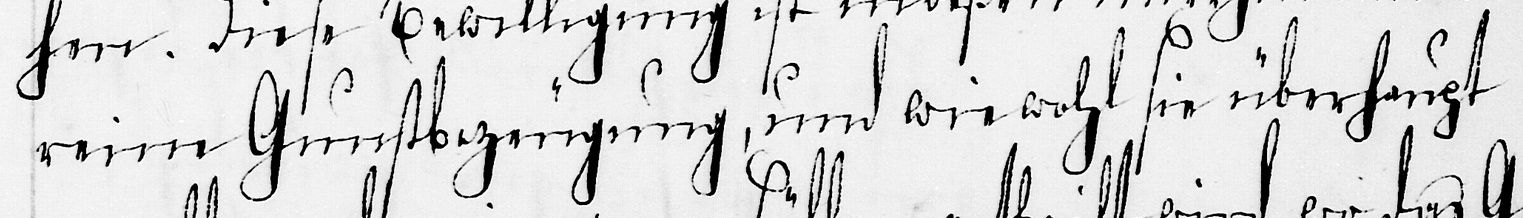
reine Gunstbezeugung, und wie wohl sie überhaupt
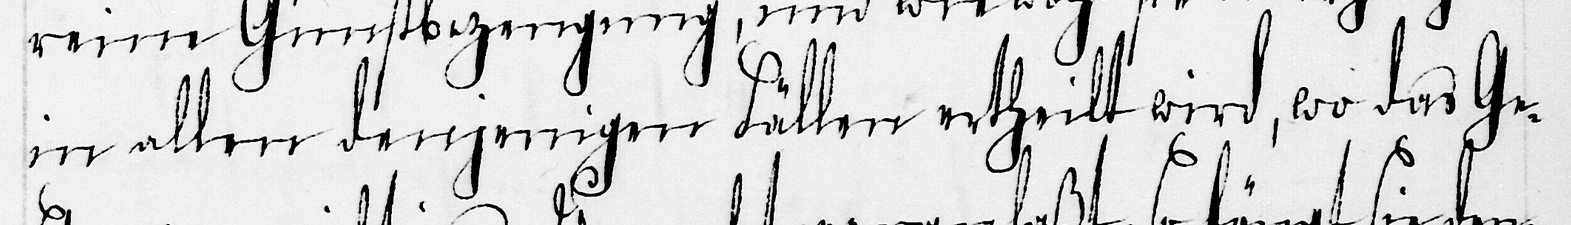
in allen denjenigen Fällen ertheilt wird, wo das Ge¬
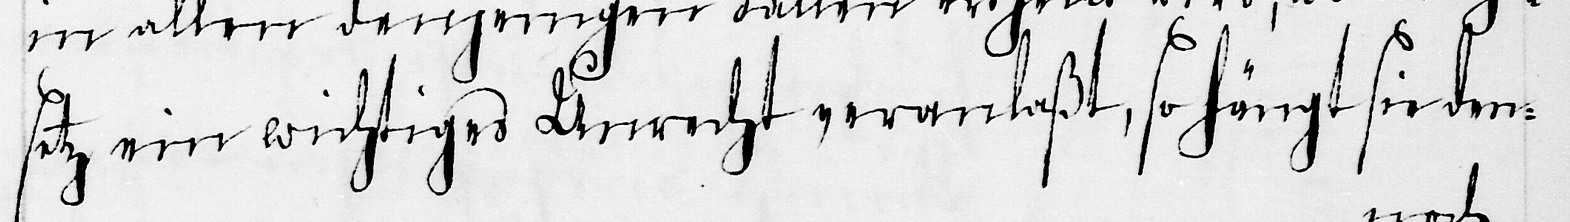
setz ein wichtiges Unrecht veranlaßt, so hängt sie den-
